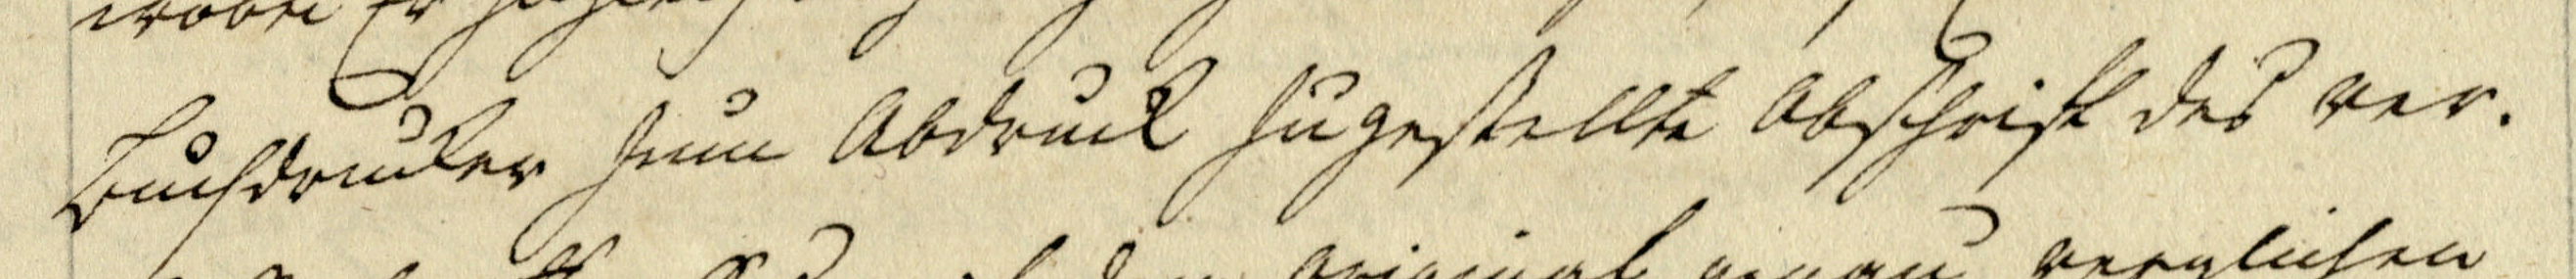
Buchdrucker zum Abdruck zugestellte Abschrift des ver¬
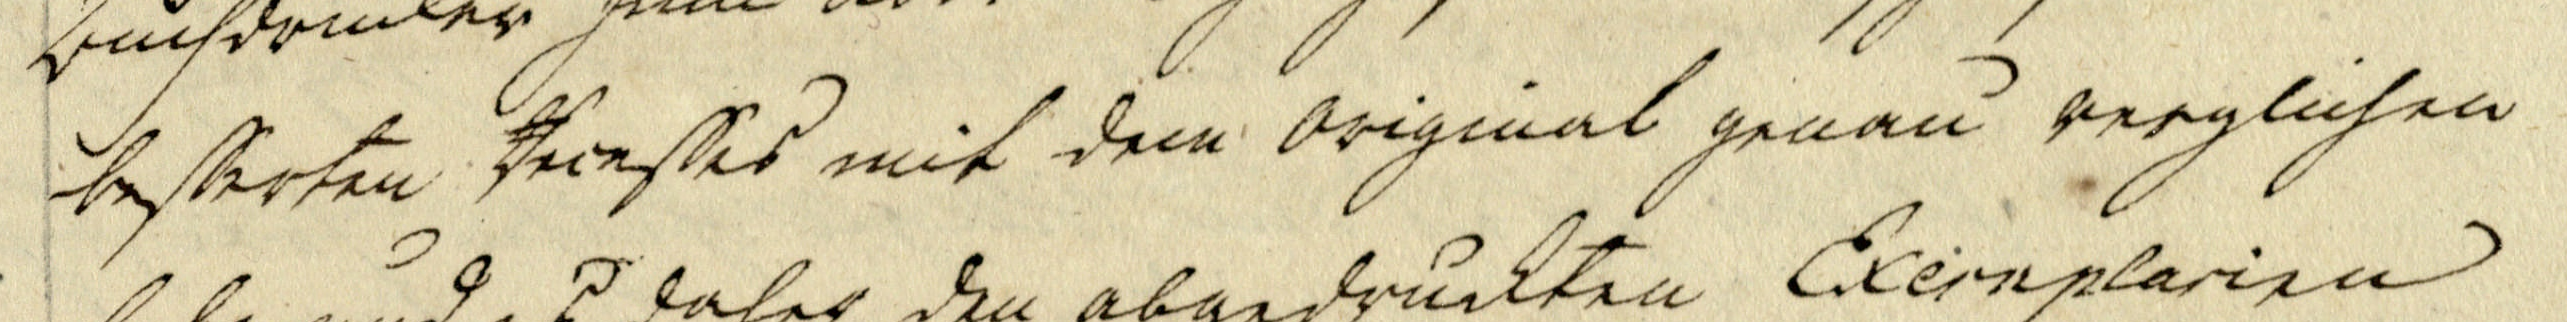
besserten Recesses mit dem Original genau verglichen
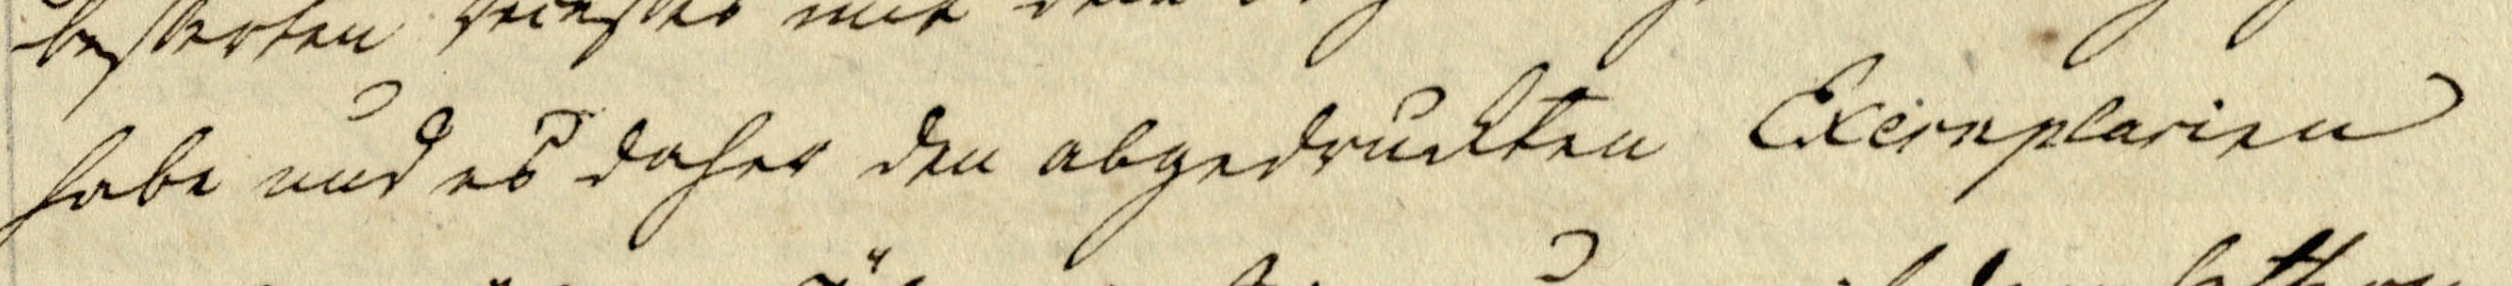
habe und es daher den abgedruckten Exemplarien
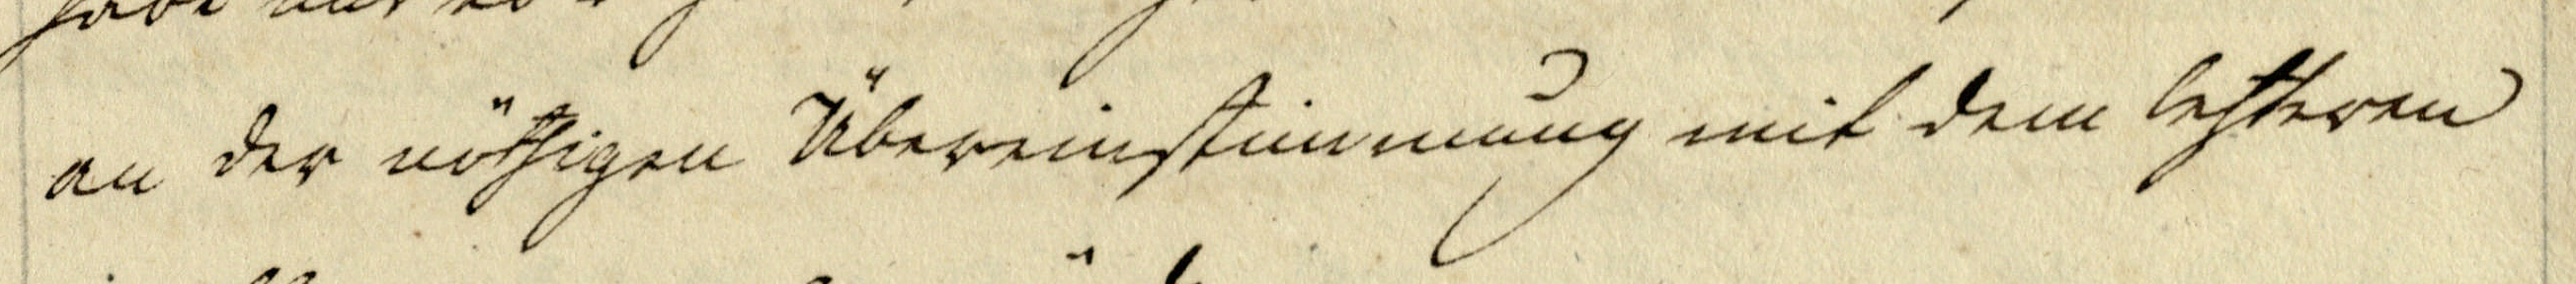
an der nöthigen Übereinstimmung mit dem letzteren
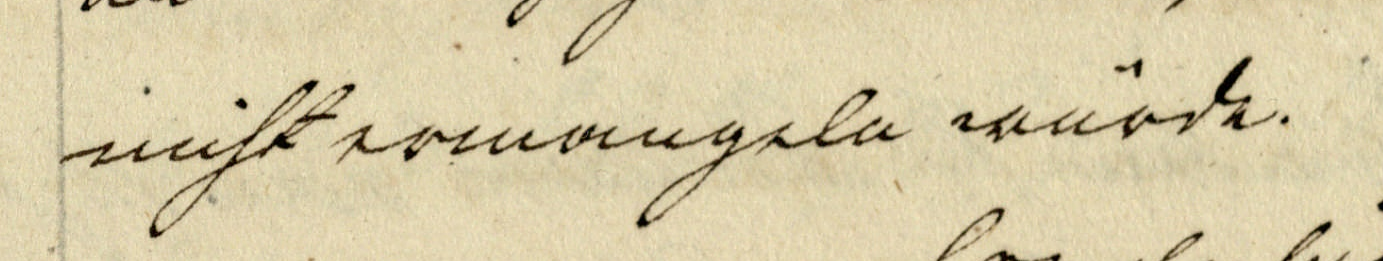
nicht ermangeln würde.
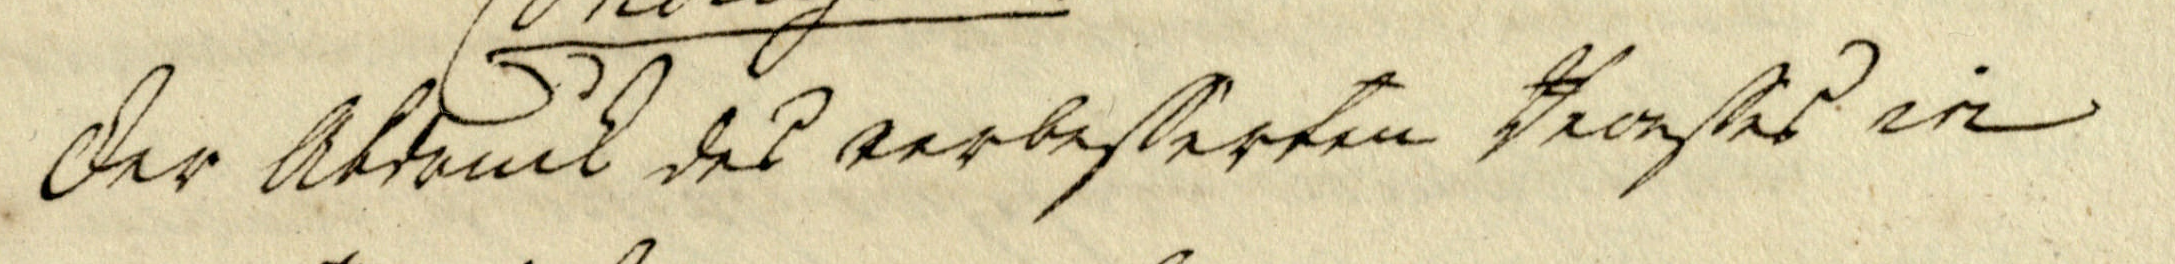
Der Abdruck des verbesserten Recesses in
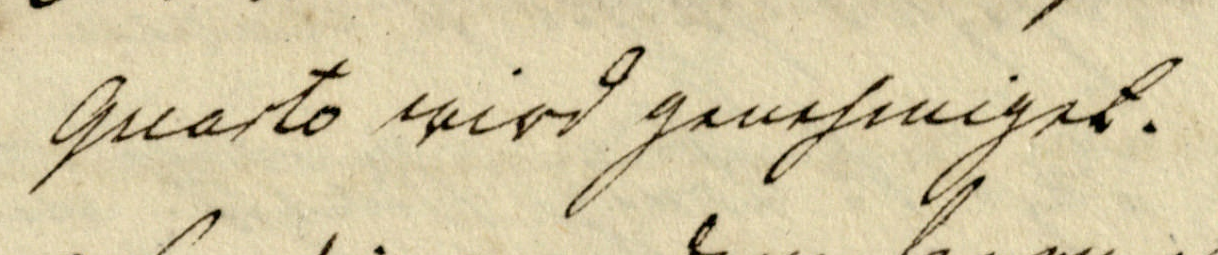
Quarto wird genehmiget
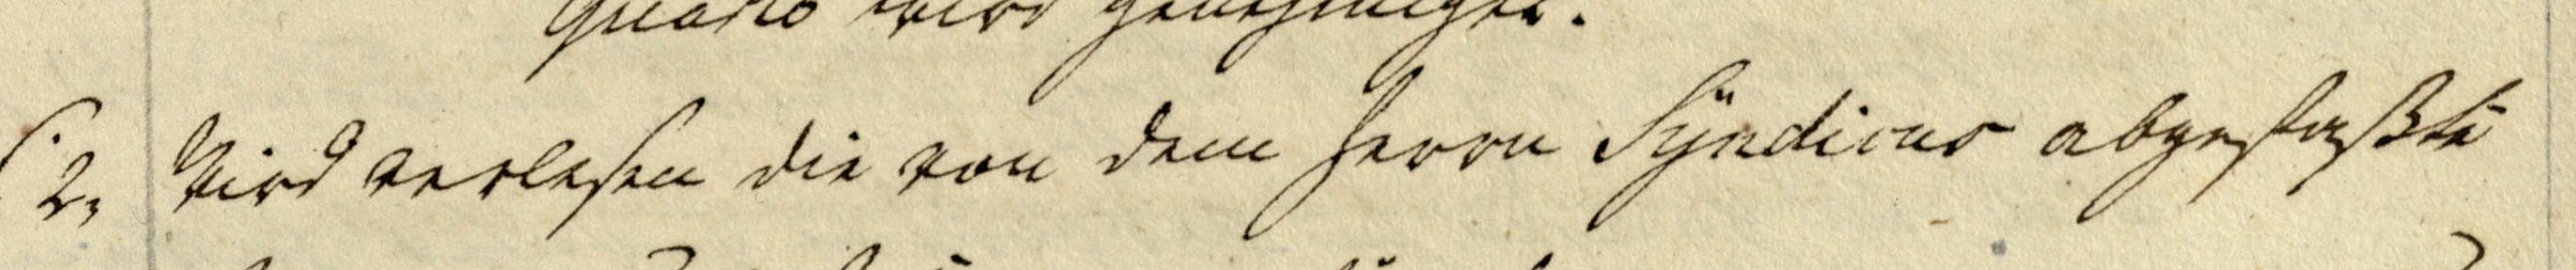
2. Wird verlesen die von dem Herrn Sÿndicus abgefaßte
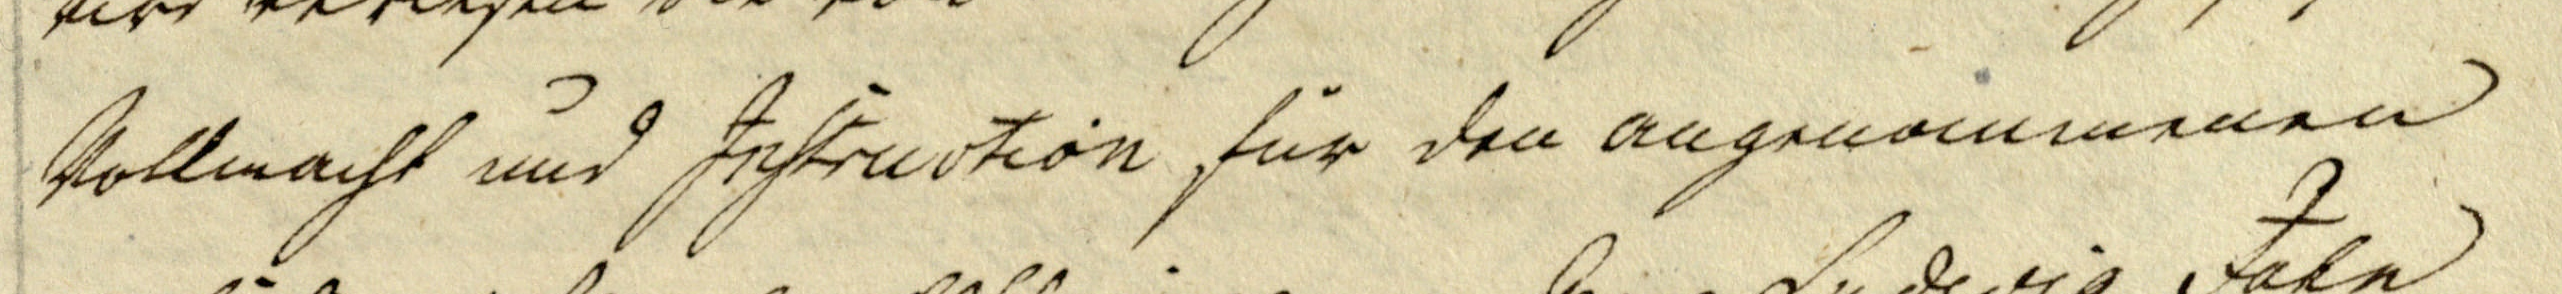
Vollmacht und Instruction für den angenommenen
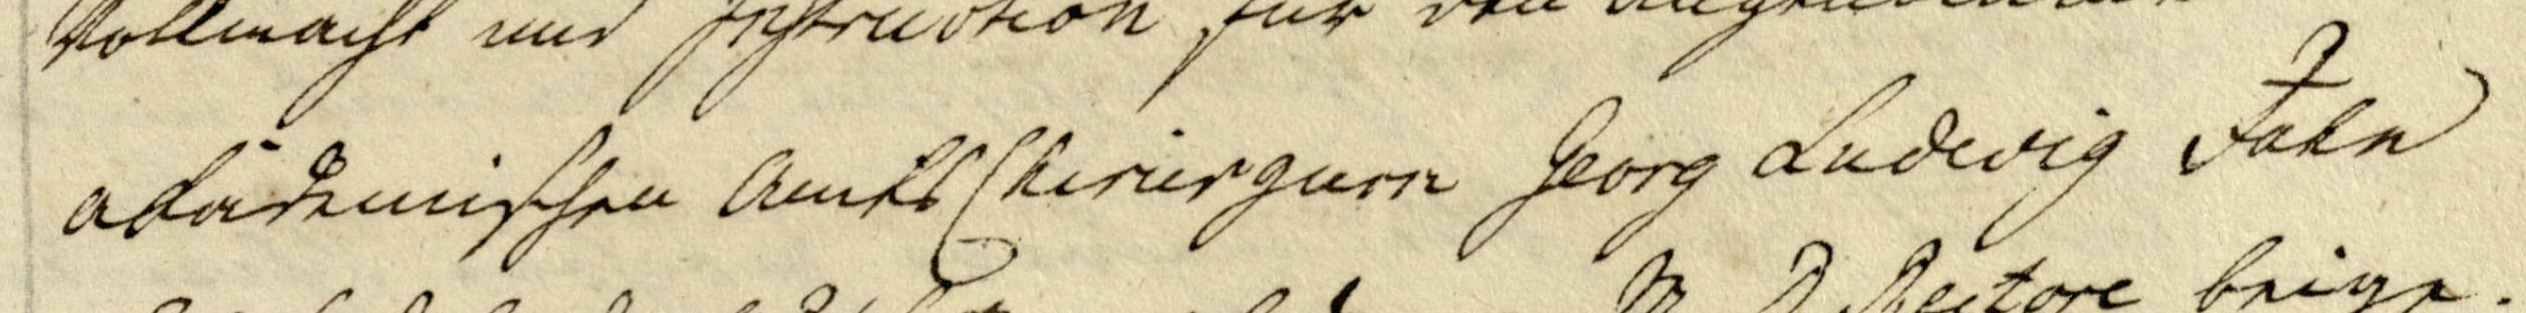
akademischen AmtsChirurgum Georg Ludwig Jahn
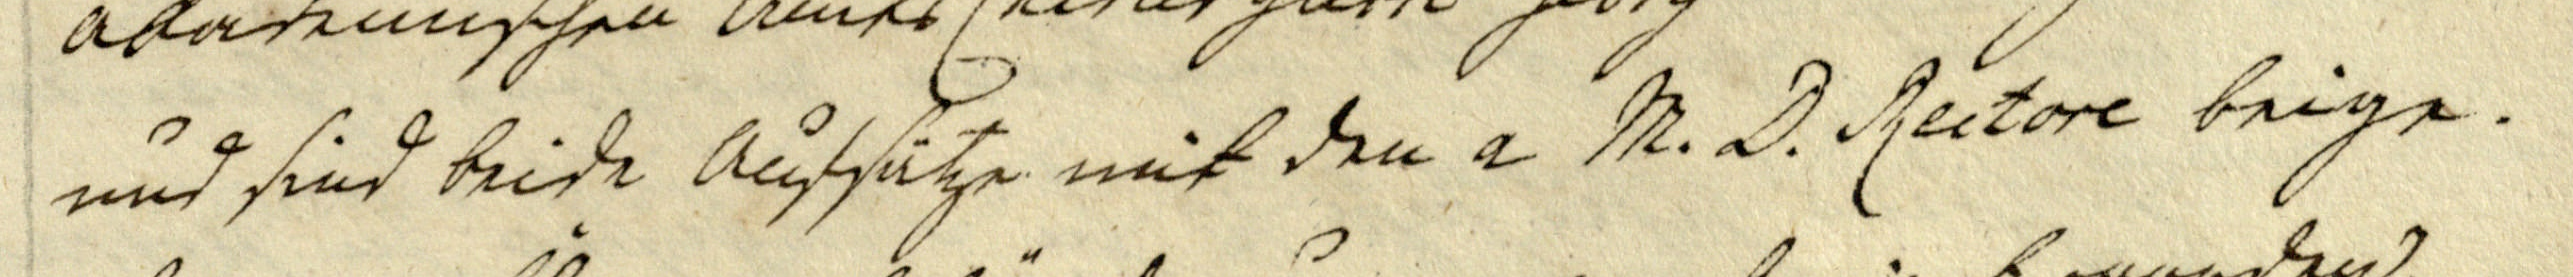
und sind beide Aufsätze mit den a M. D. Rectore beige¬
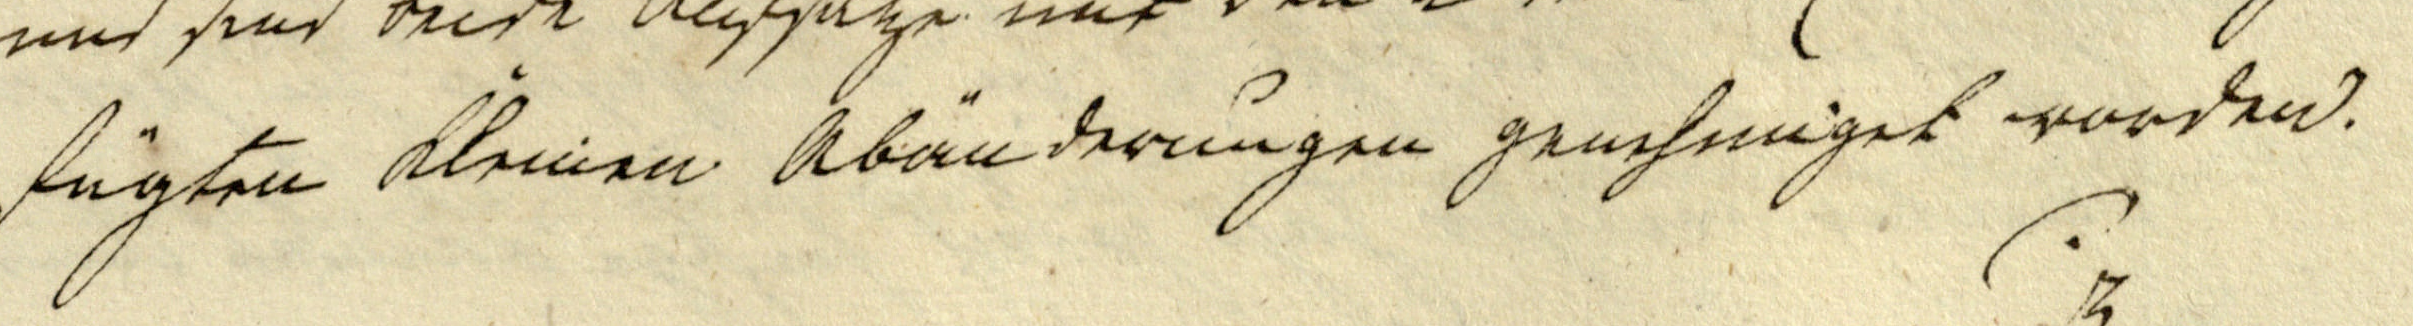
fügten kleinen Abänderungen genehmiget worden.
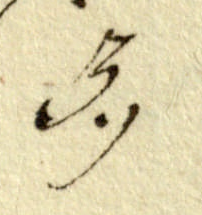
3.,
